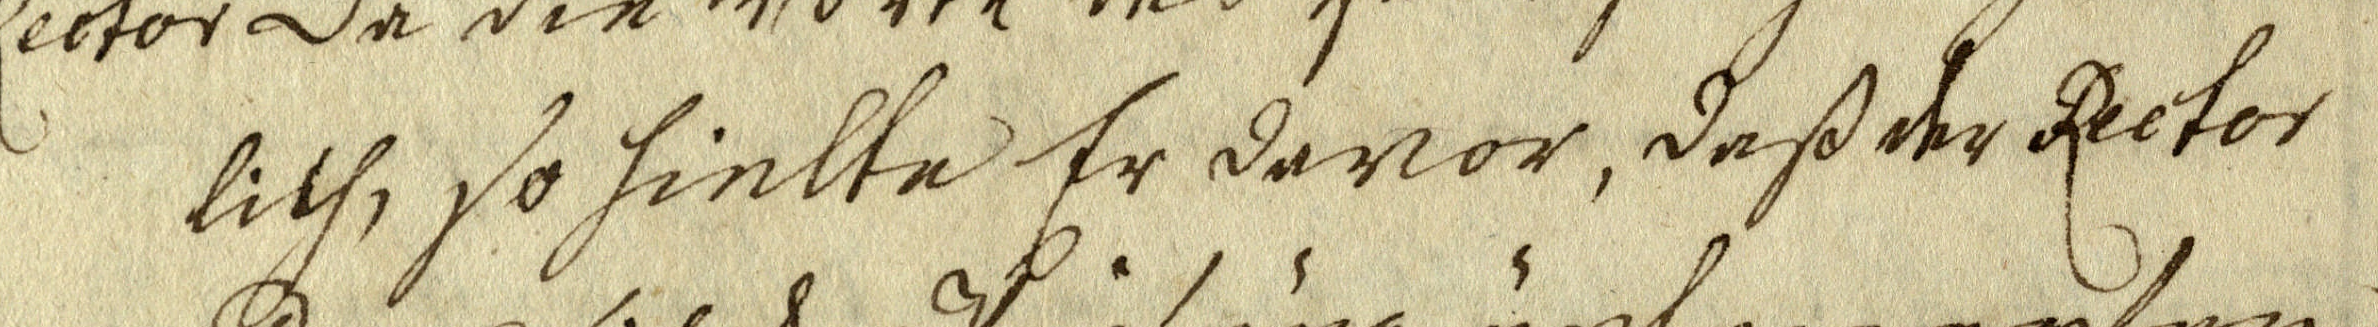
lich so hielte Er davor, daß der Rector
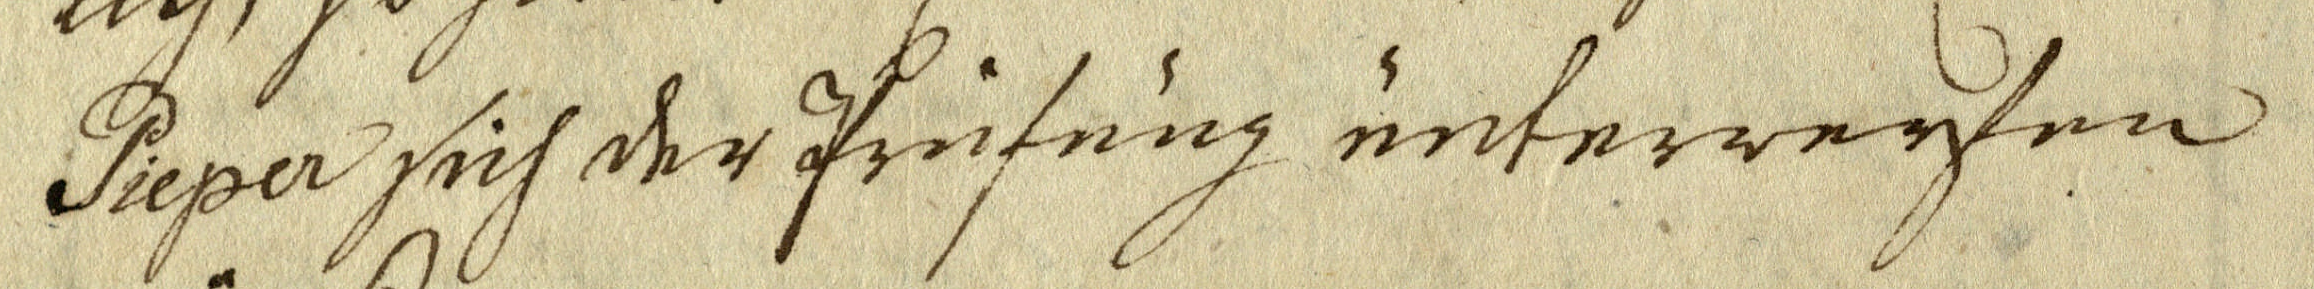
Pieper sich der Prüfung unterwerfen
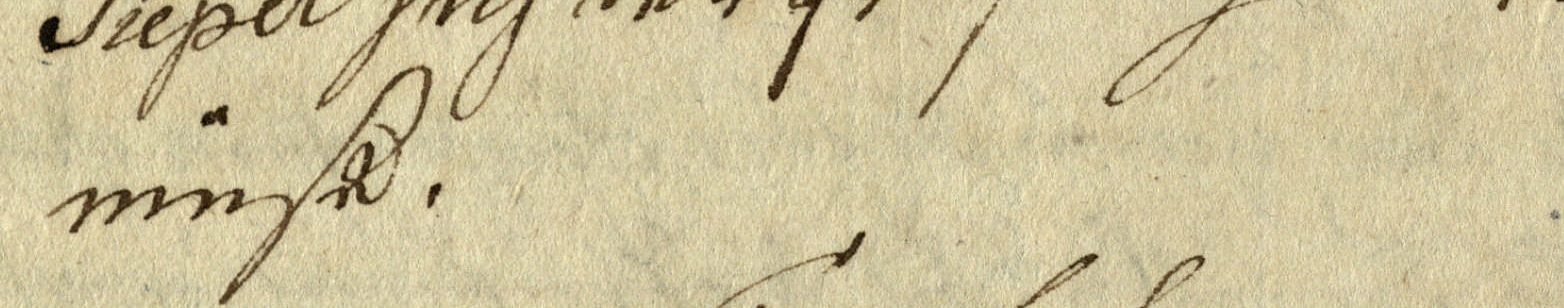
müße.
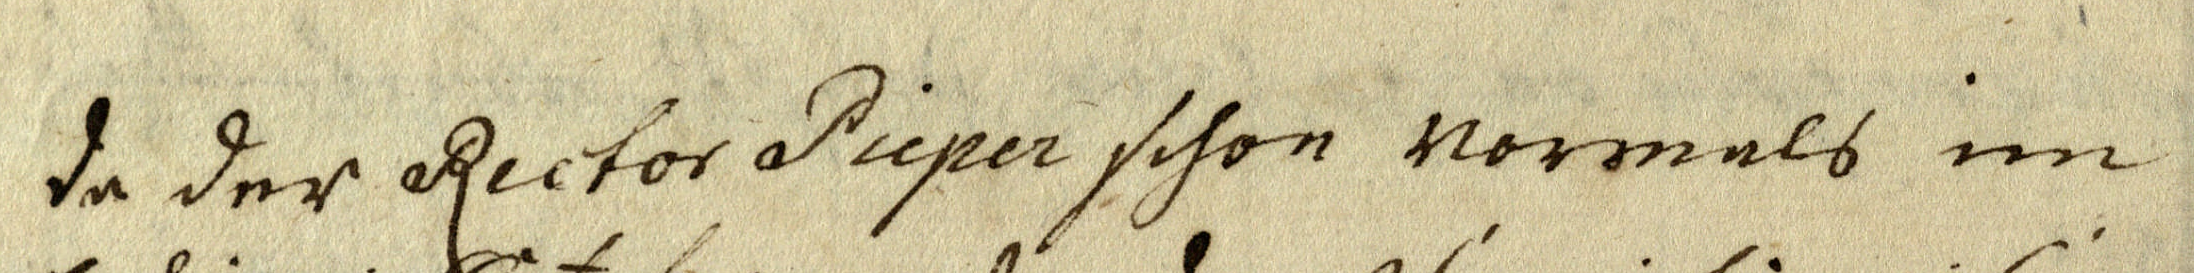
da der Rector Pieper schon vormals im
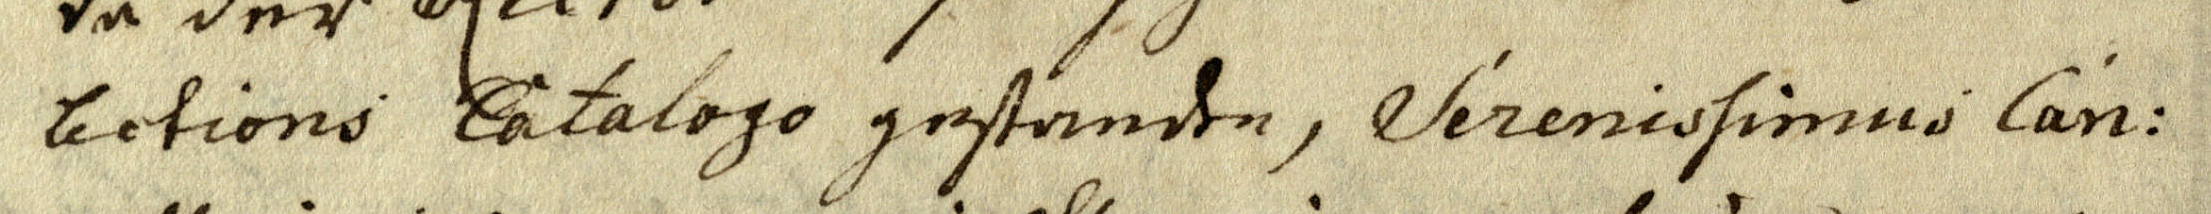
Lections Catalogo gestanden, Serenissimus Can¬
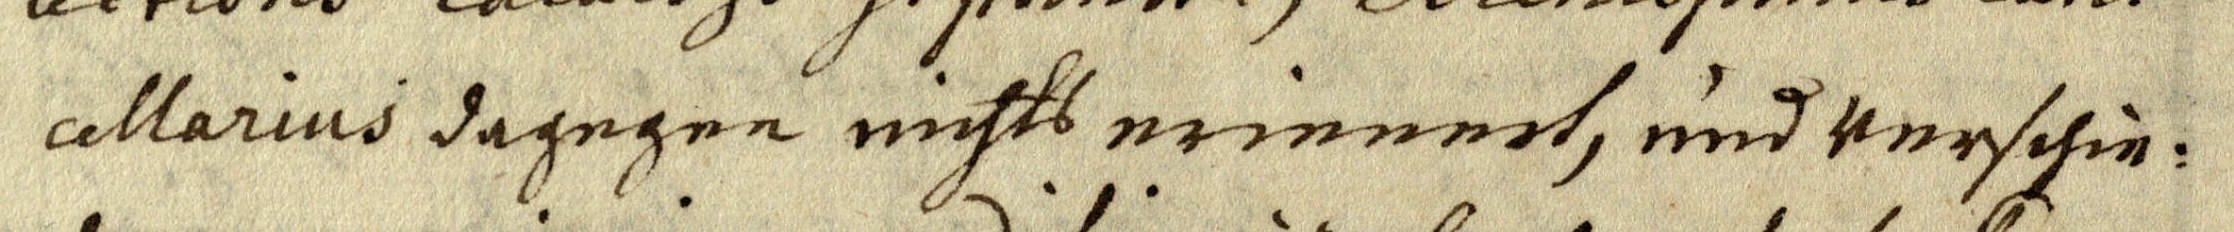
cellarius dagegen nichts erinnert, und verschie¬
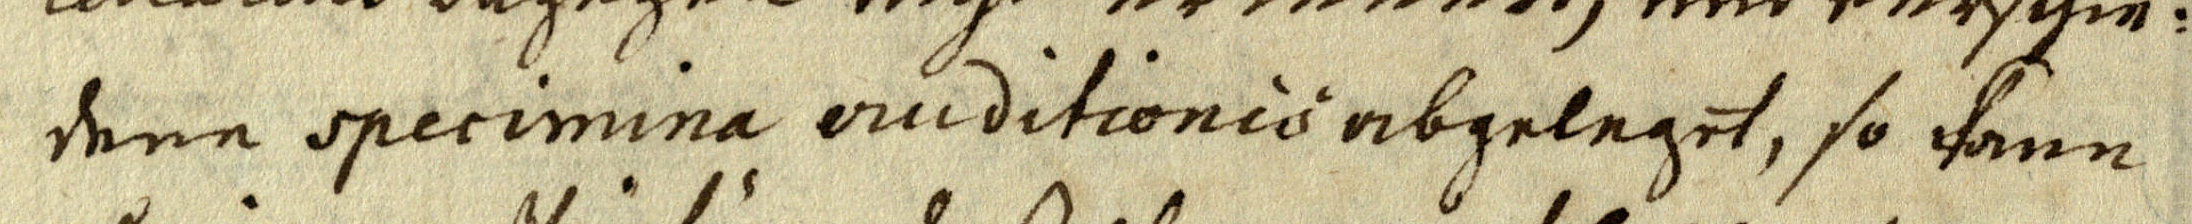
dene specimina eruditionis abgeleget, so kann
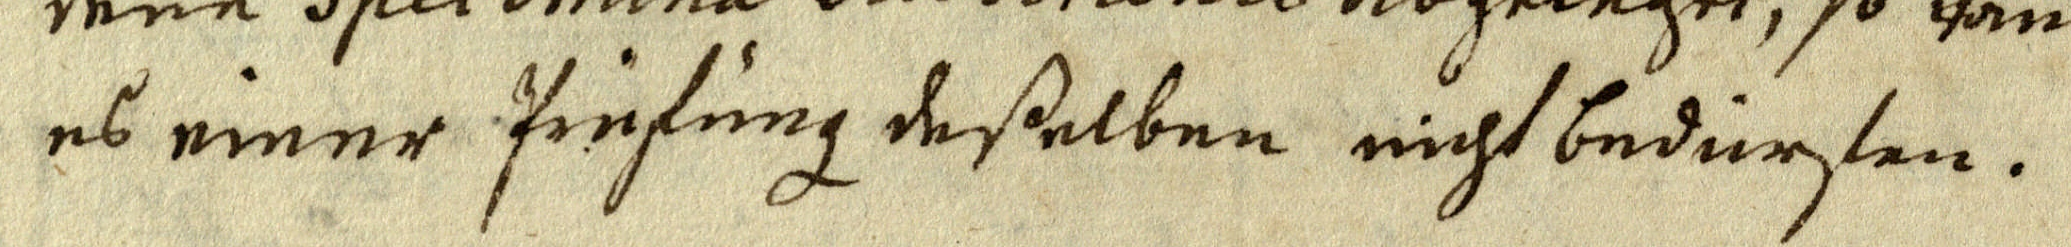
es einer Prüfung deßelben nicht bedürfen.
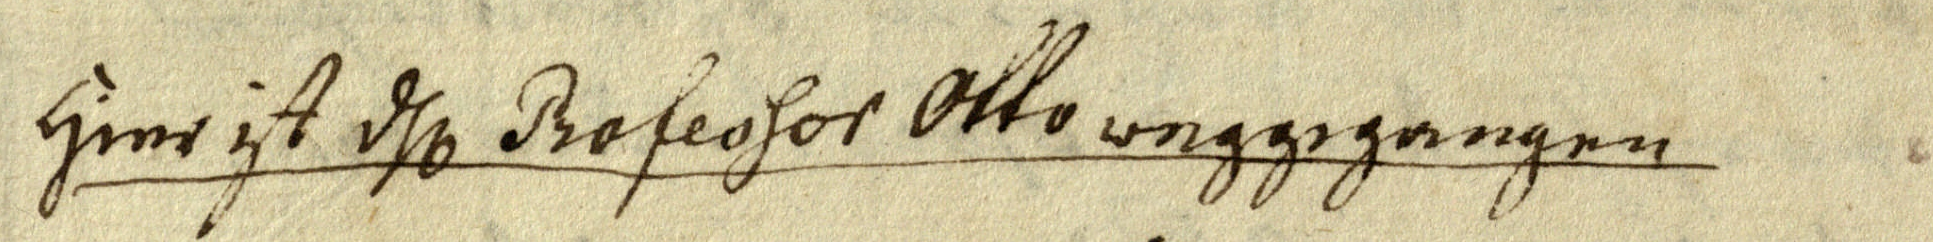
Hier ist dh Professor Otto weggegangen.
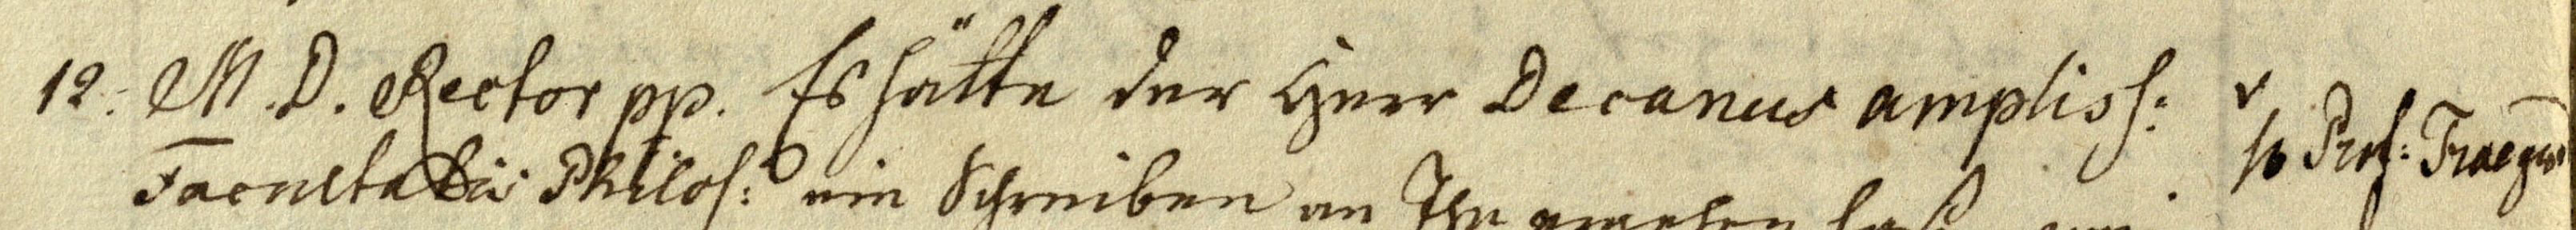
12. M.D. Rector pp. Es hätte der Herr Decanus ampliss: h. Prof: Traegård
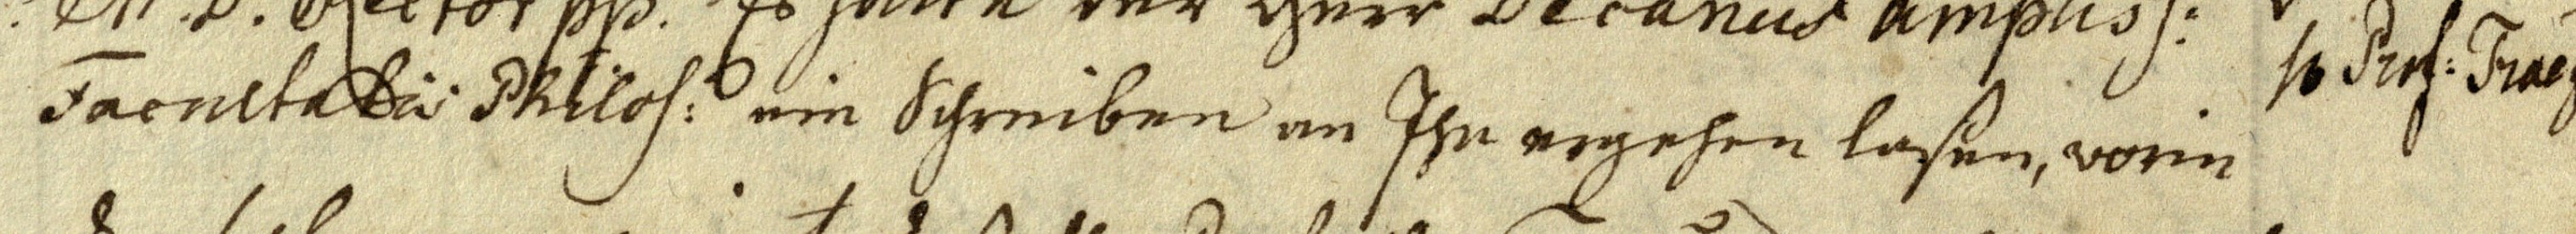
Facultatis Philos: ein Schreiben an Ihn ergehen laßen, worin
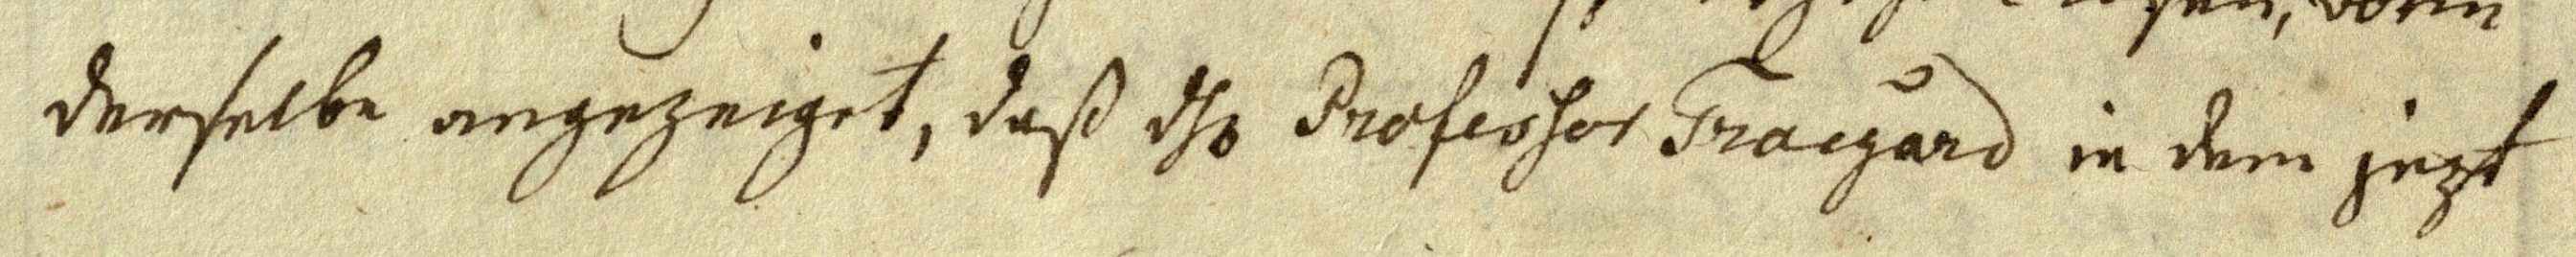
derselbe angezeiget, daß dh Professor Traegård in dem jezt
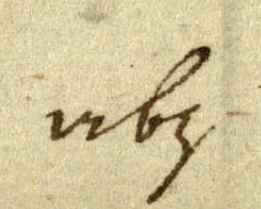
abz
